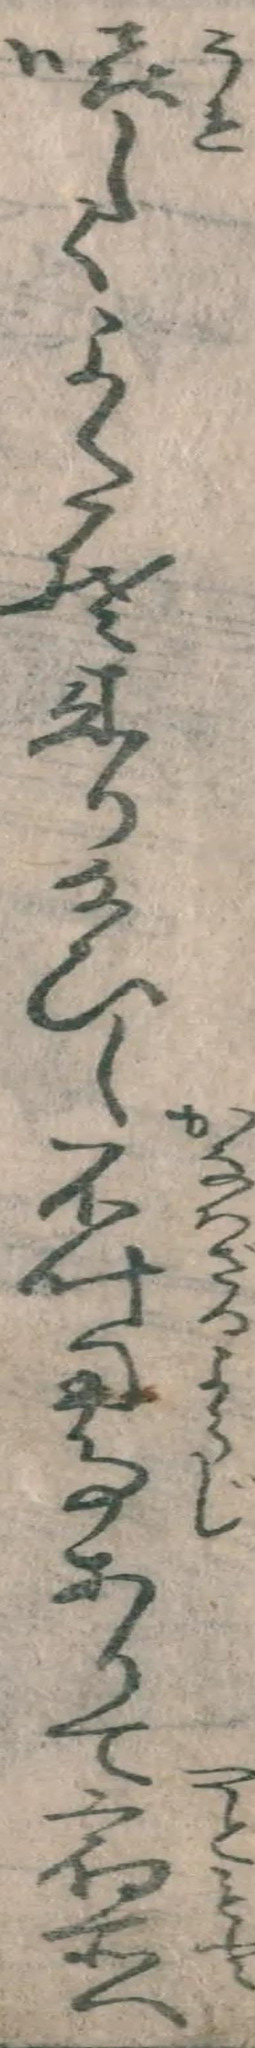嬉しくよくそ来り給ひし不叶用事ありて宿所へ
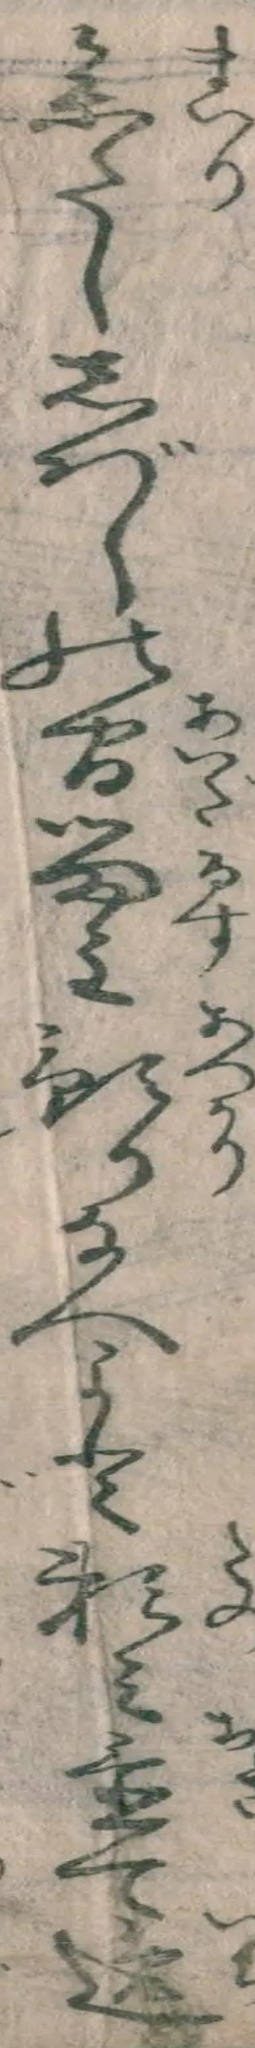参たししばしの間留主預給へよと頼み置て逸
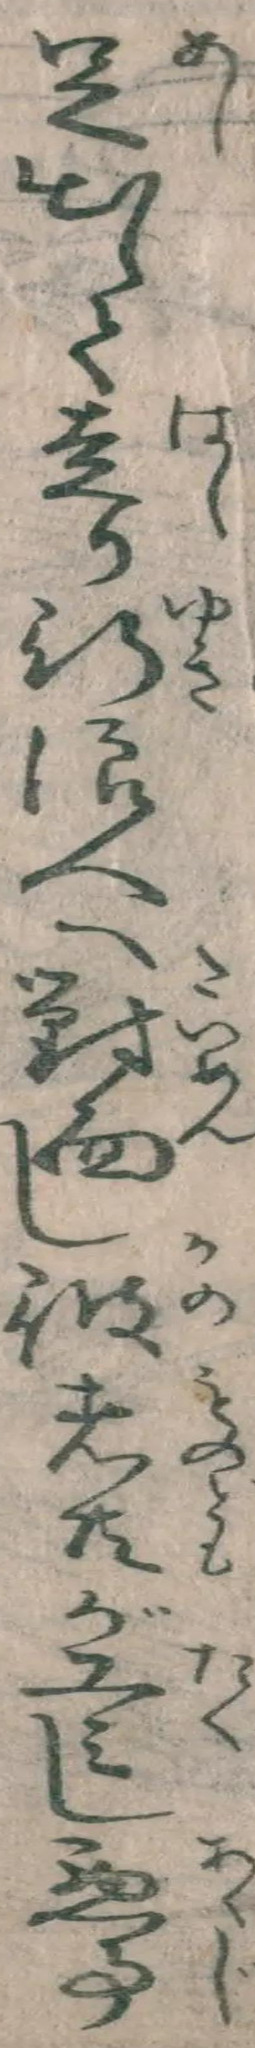足出して走り行浪人へ対面し彼者共が工みし悪事
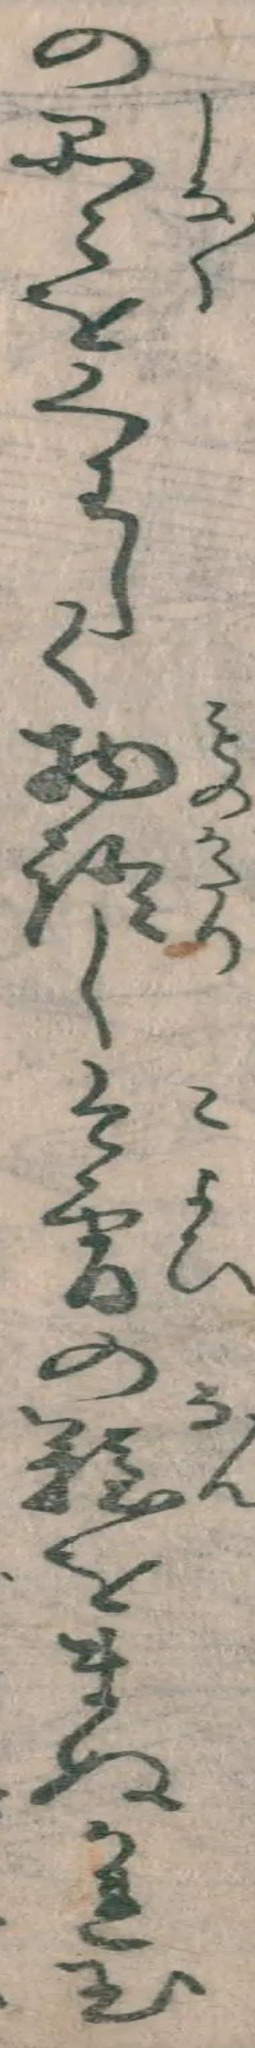の品々をくわしく物語し今宵の難をまぬかれ玉
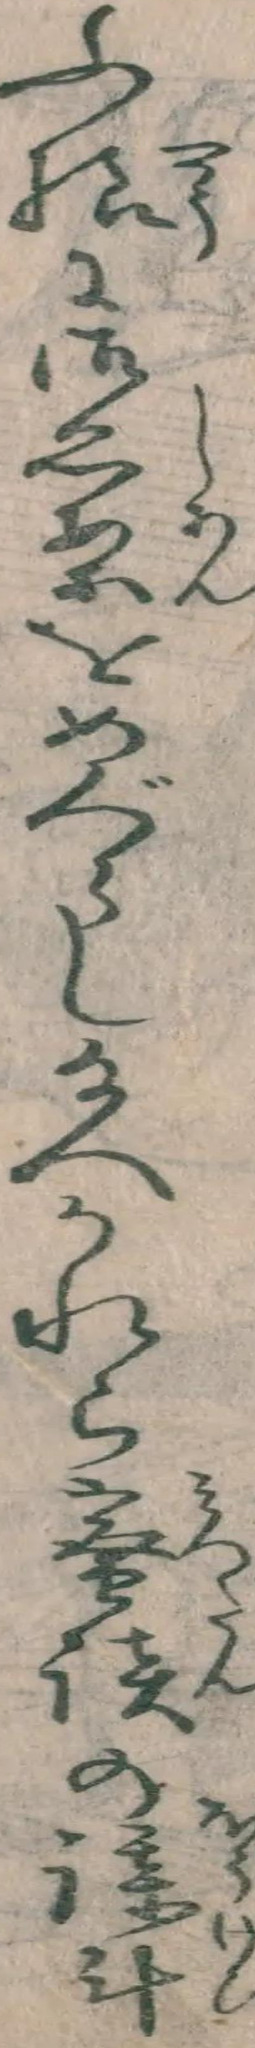ふ様に御思案をめぐらし給へかれら蜜談の謀計
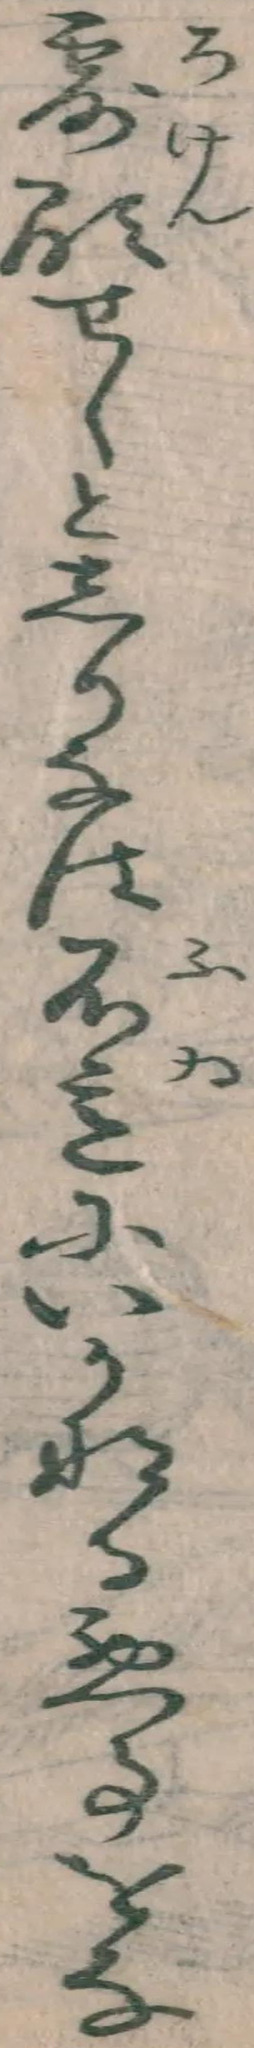露顕せしとしりなは不意にいかなる悪事をな
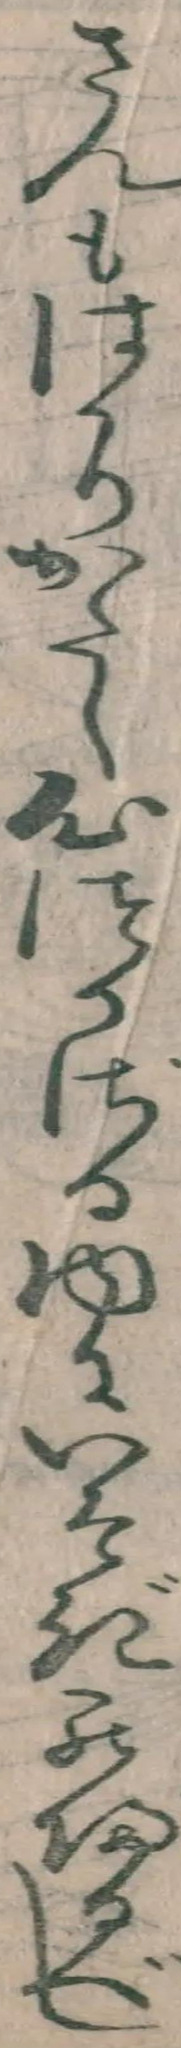さんもはかりかたし心つかざる内にいそぎ罷帰るべし
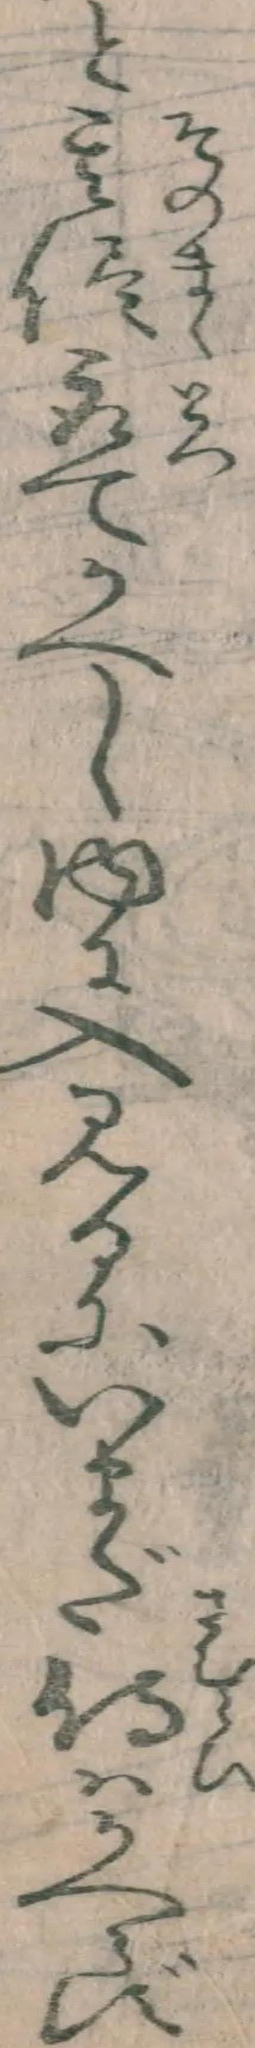と其侭取てかへし内に入見るにいまだ侍はかへらず
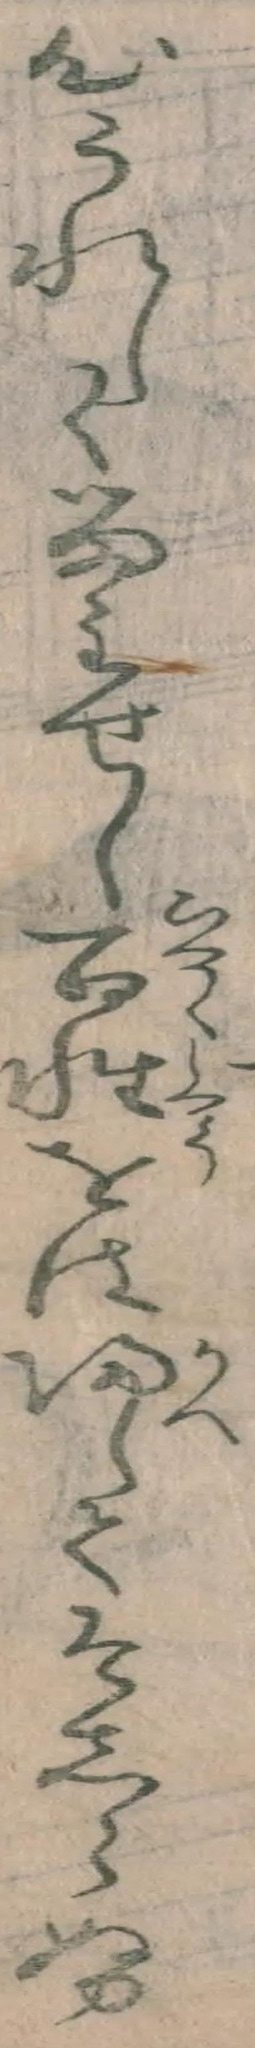心うれしく留主せし百姓をは帰してそしらぬ
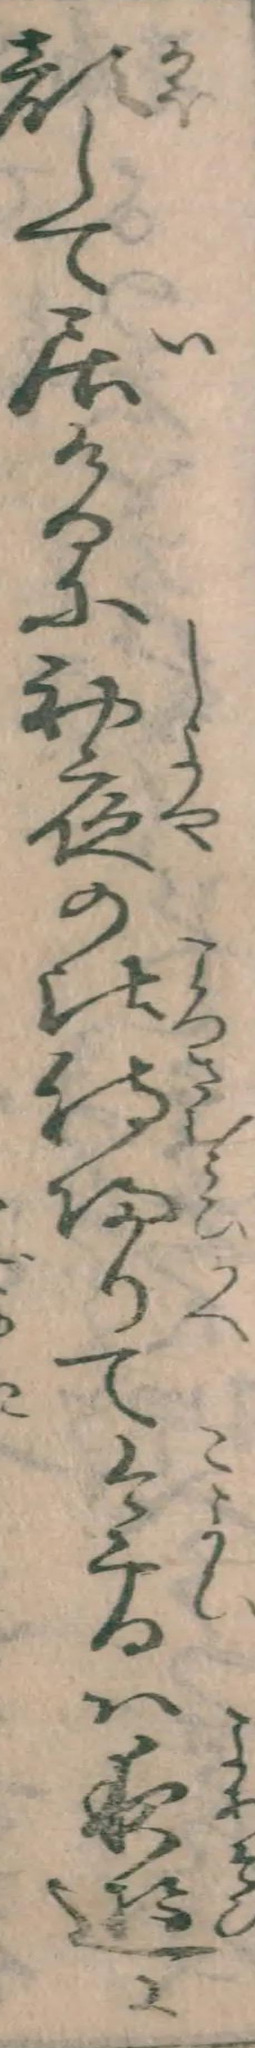顔して居けるに初夜の頃侍帰りて今宵は夜遊に
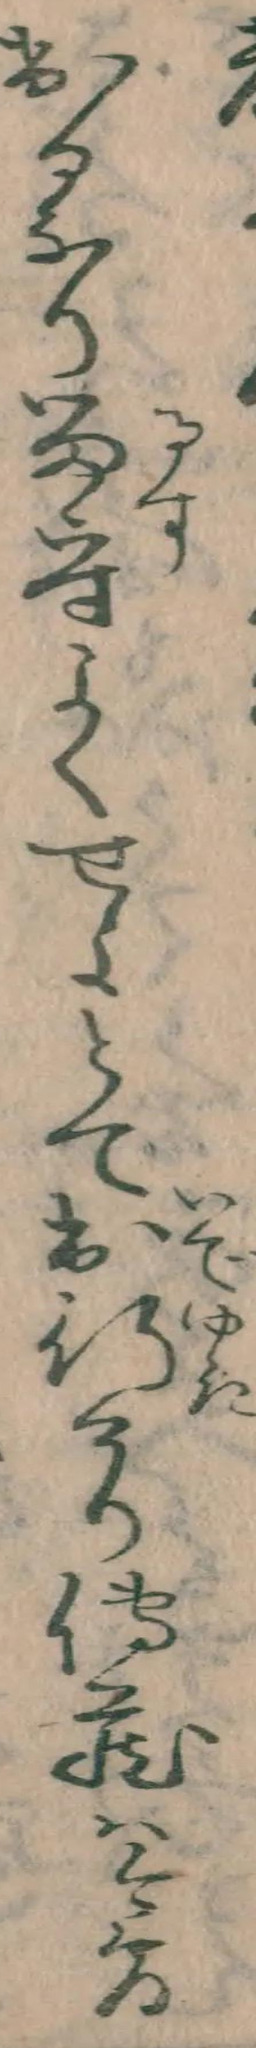出るなり留守よくせよとて出行けり伝蔵は今宵
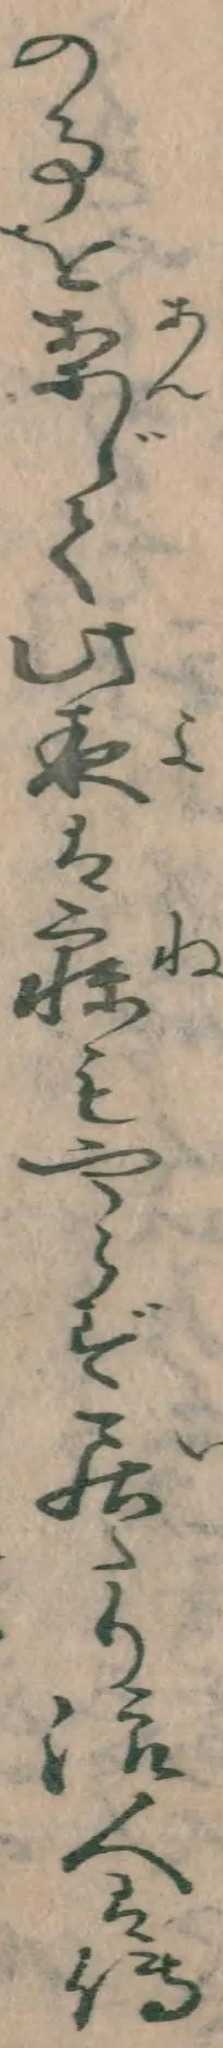の事を案じて此夜は寐もやらず居たり浪人は伝
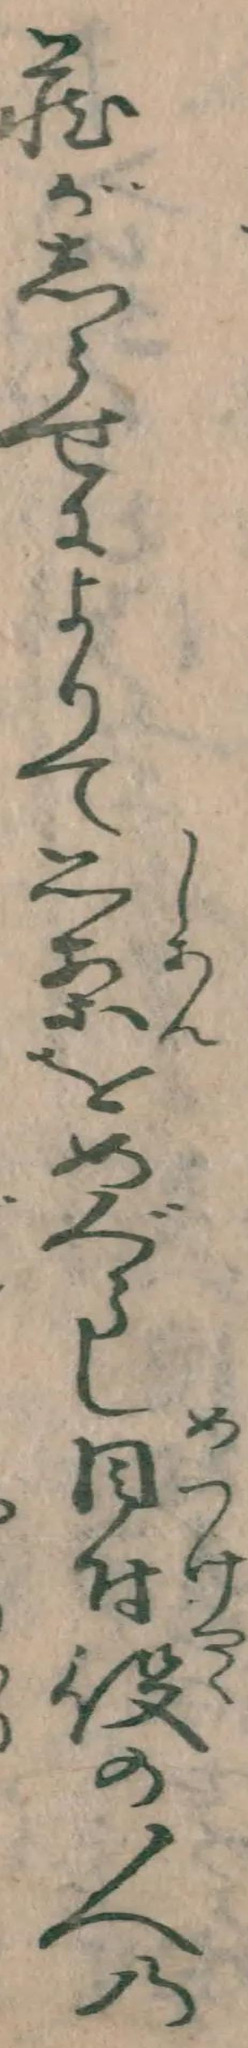蔵がしらせによりて思案をめぐらし目付役の人の
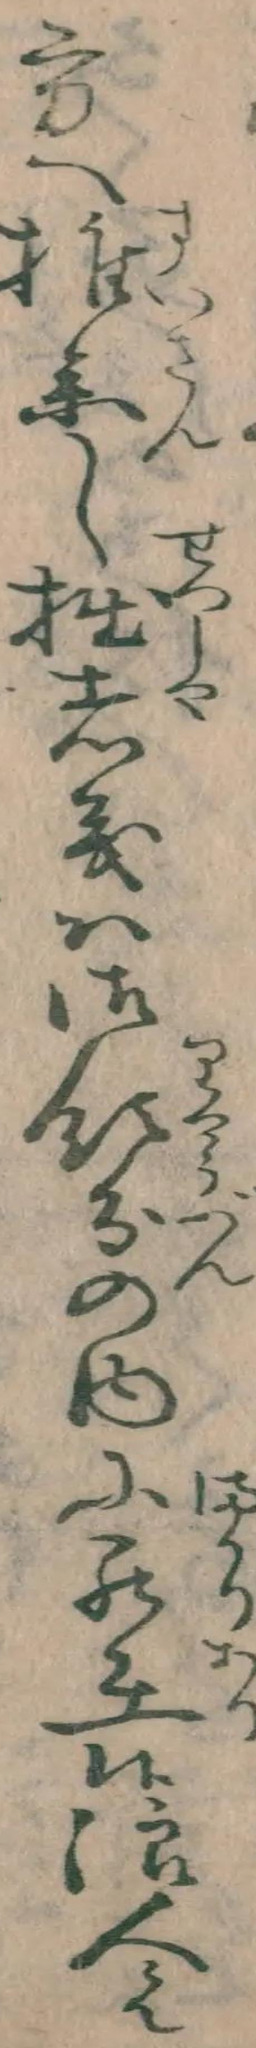方へ推参し拙者義は御領分の内に罷在候浪人にて
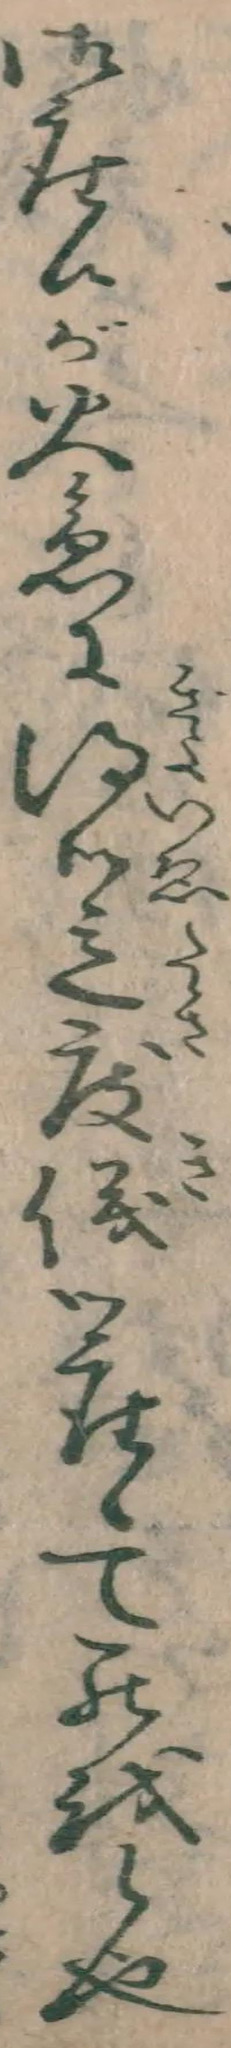御座候が火急に得御意度儀御座候て罷越候也
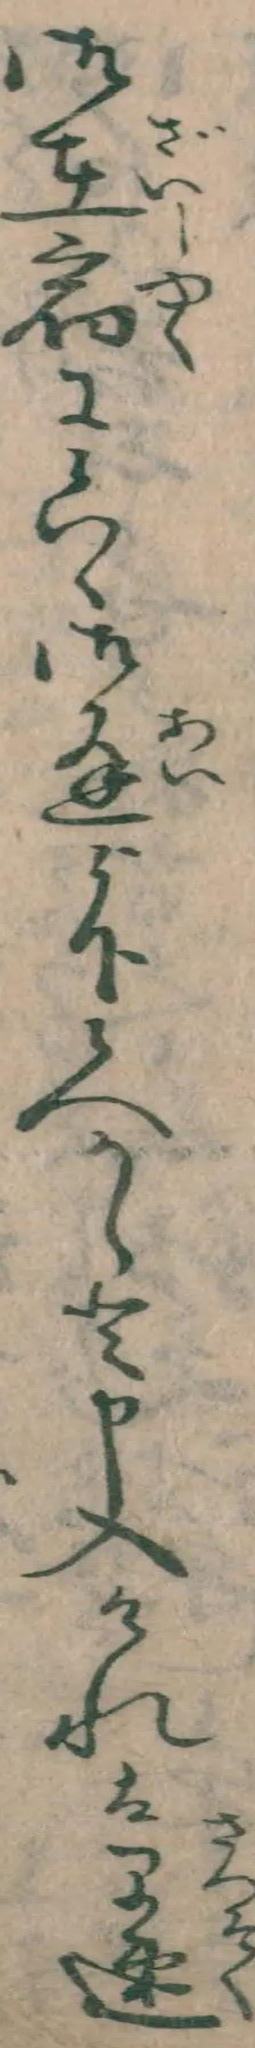御在宿に候はゝ御逢被下候へかしと申入けれは早速
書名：怪談御伽童 5巻. [2]
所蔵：国立国会図書館 National Diet Library, JAPAN
